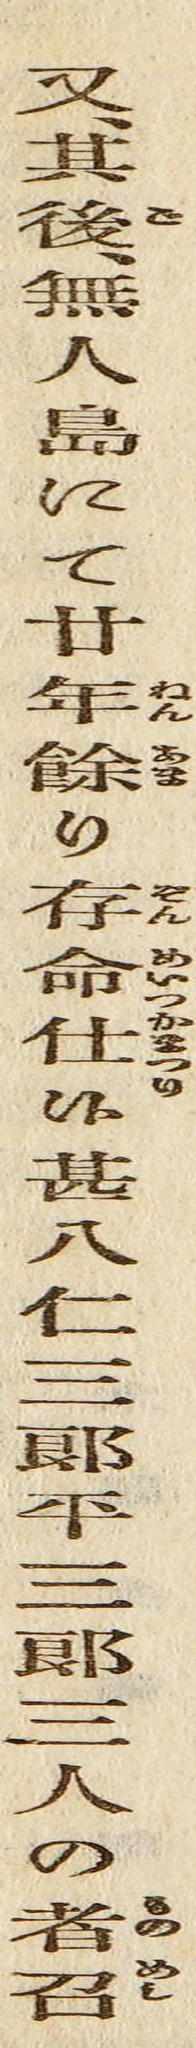又、其後、無人島にて廿年余り存命仕候甚八仁三郎平三郎三人の者召
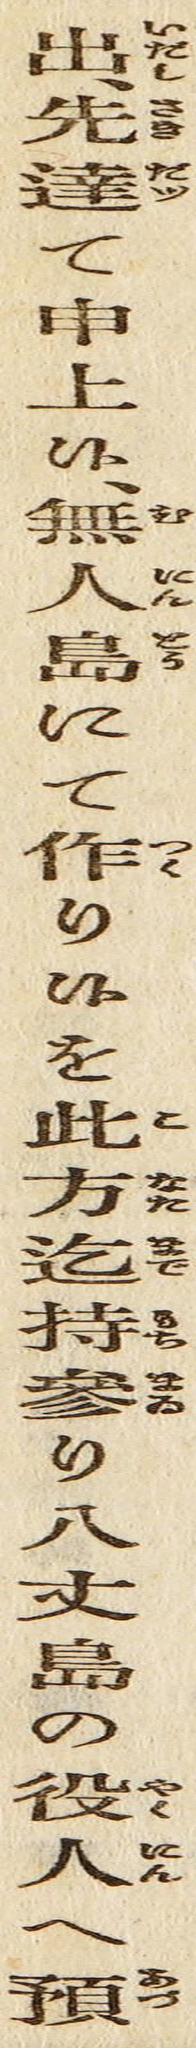出、先達て申上候、無人島にて作り候を此方迄持参り八丈島の役人へ預
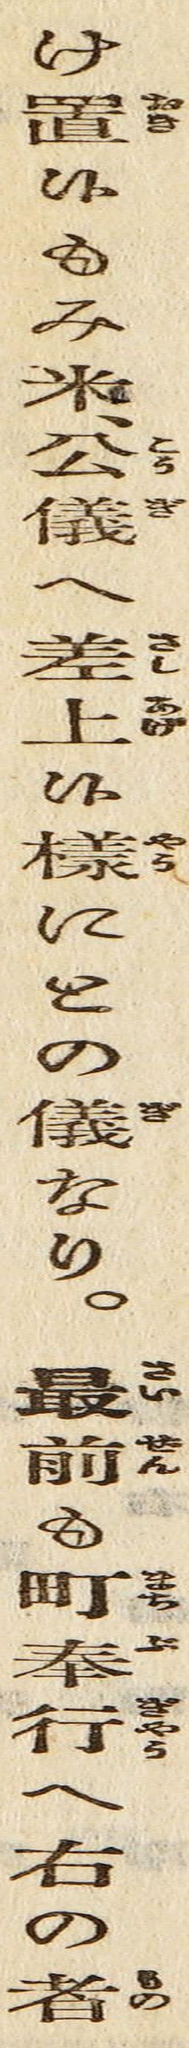け置候もみ米、公儀へ差上候様にとの儀なり。最前も町奉行へ右の者
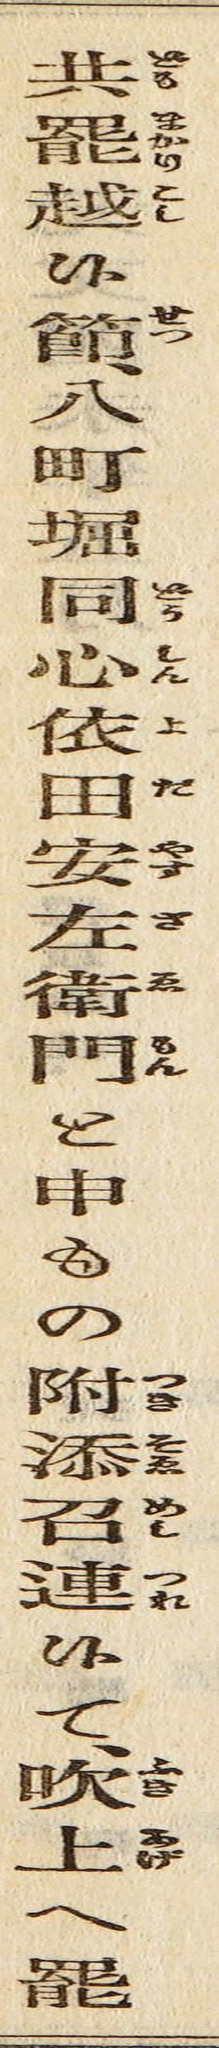共罷越候節、八町堀同心依田安左衛門と申もの附添召連候て、吹上へ罷
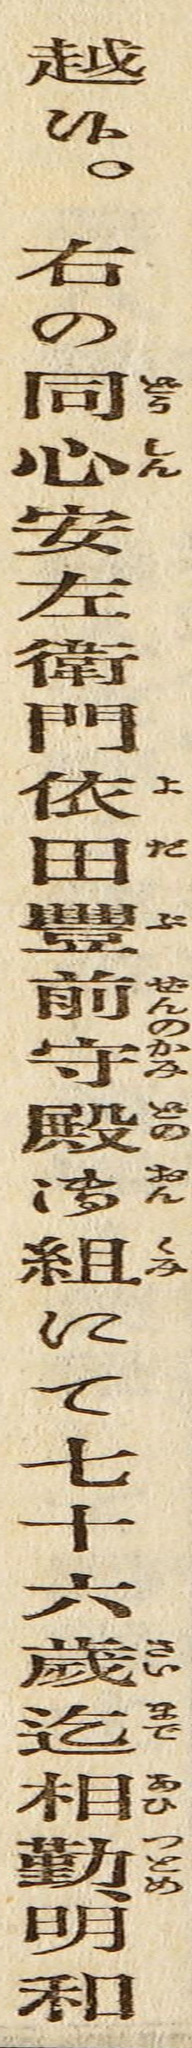越候。右の同心安左衛門依田豊前守殿御組にて七十六歳迄相勤、明和
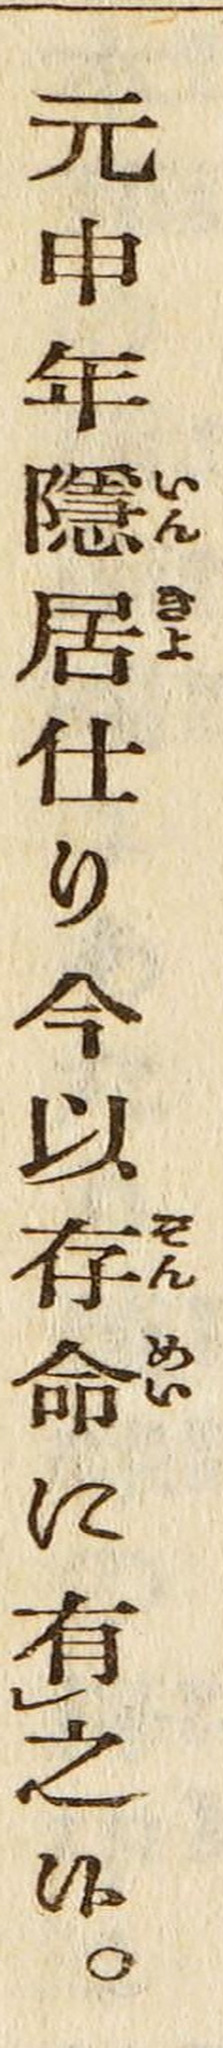元申年隠居仕り今以存命に有之候。
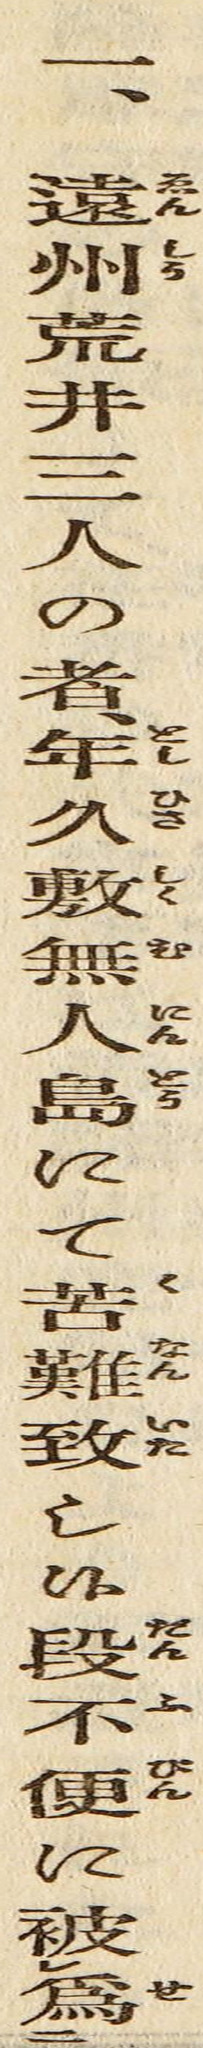一、遠州荒井三人の者、年久敷無人島にて苦難致し候段不便に被為
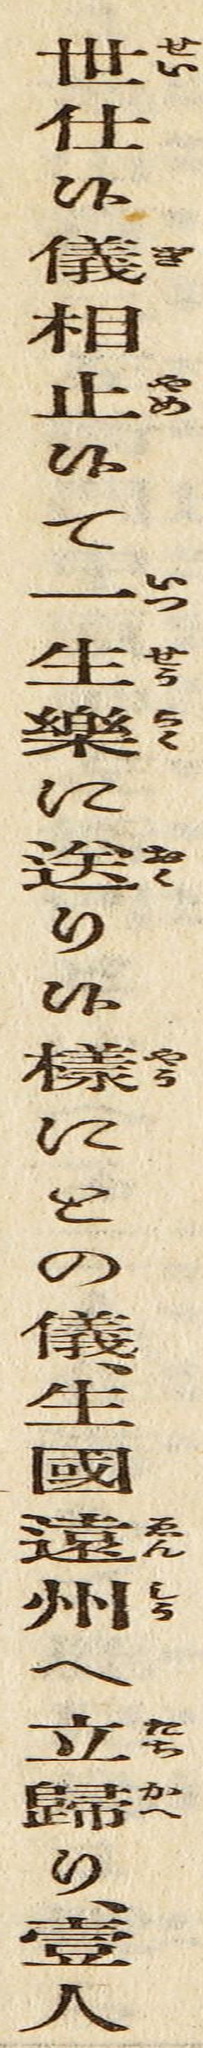世仕候儀相止候て一生楽に送り候様にとの儀、生国遠州へ立帰り、壱人
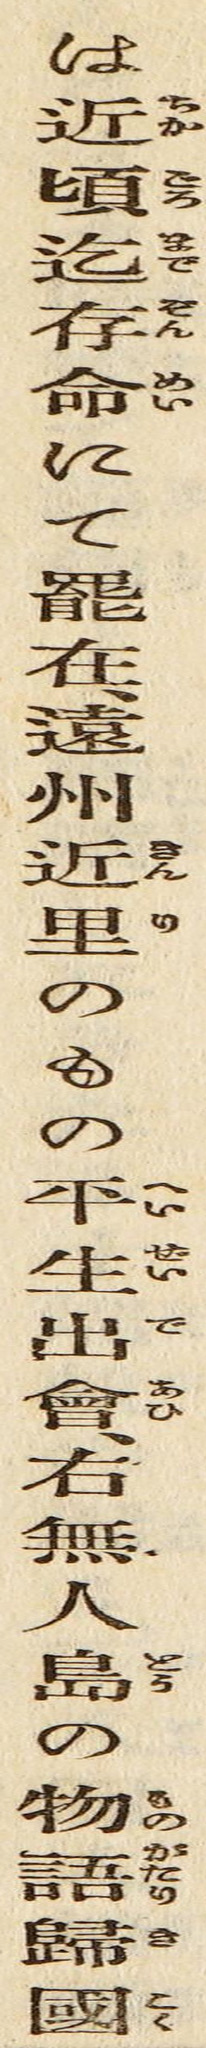は近頃迄存命にて罷在、遠州近里のもの平生出会、右無人島の物語帰国
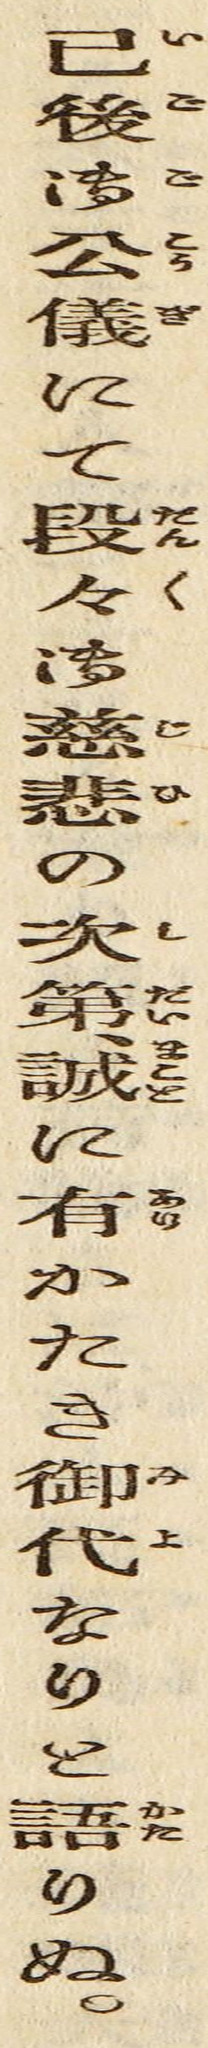已後御公儀にて段々御慈悲の次第、誠に有かたき御代なりと語りぬ。

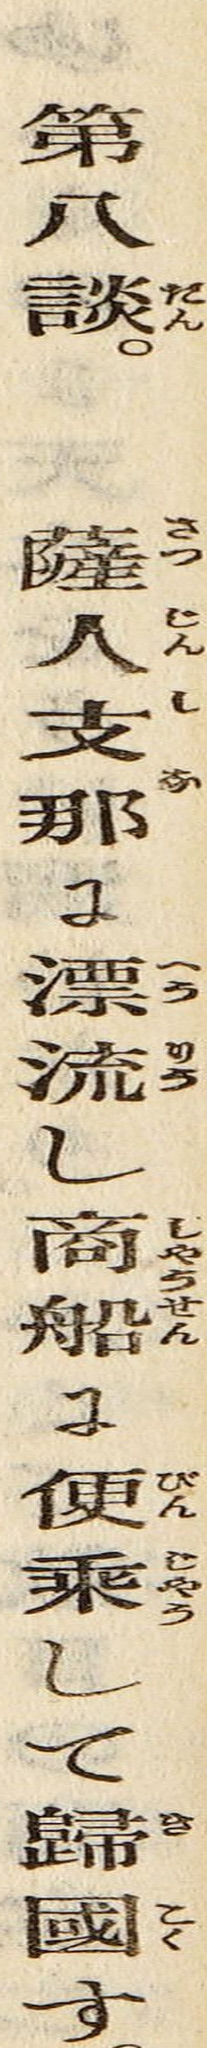第八談。薩人支那に漂流し商船に便乗して帰国す。
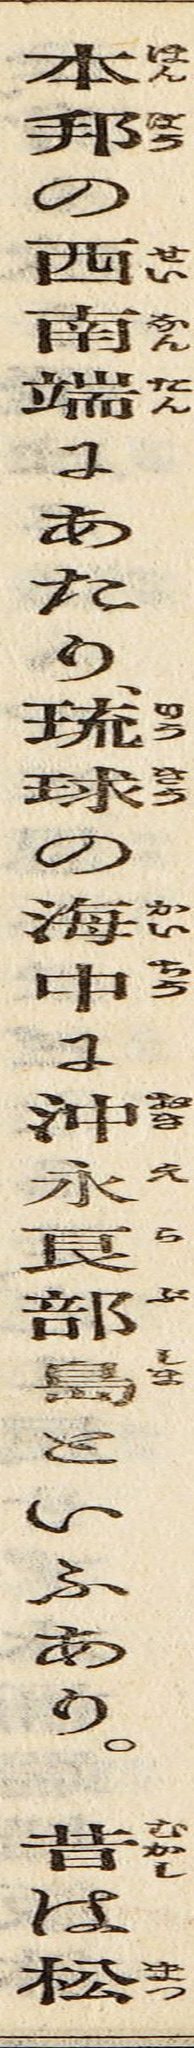本邦の西南端にあたり、琉球の海中に沖永良部島といふあり。昔は松
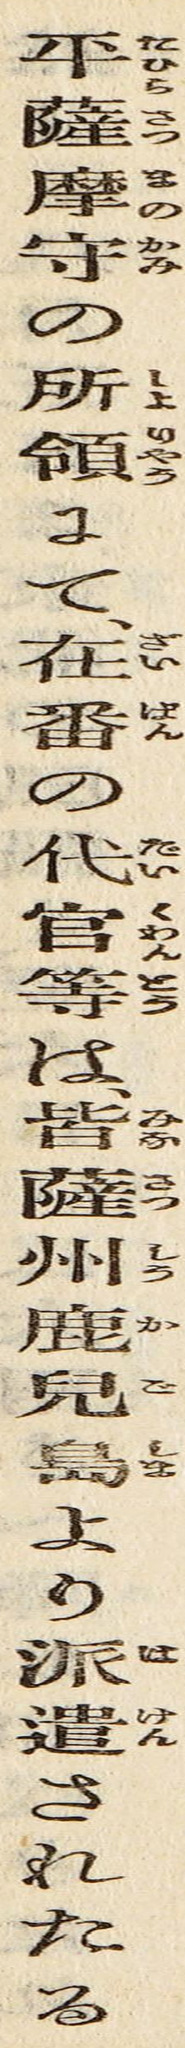平薩摩守の所領にて、在番の代官等は、皆薩州鹿児島より派遣されたる
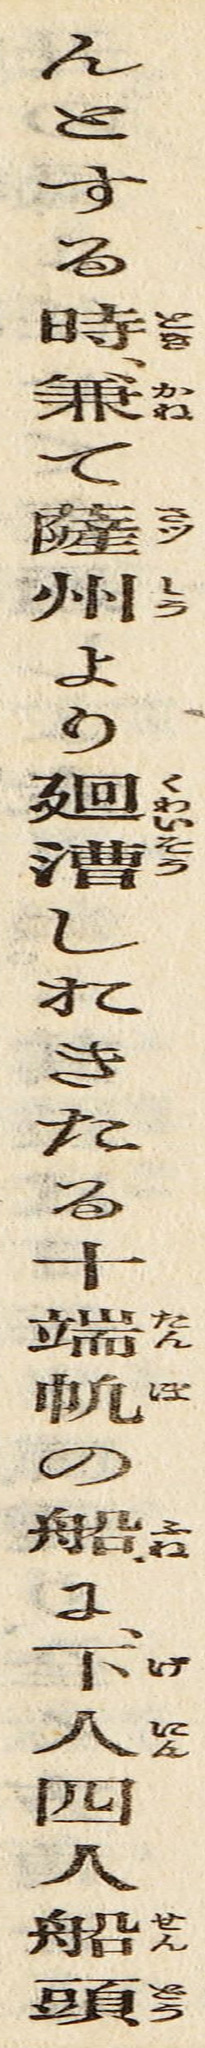んとする時、兼て薩州より廻漕しおきたる十端帆の船に、下人四人船頭
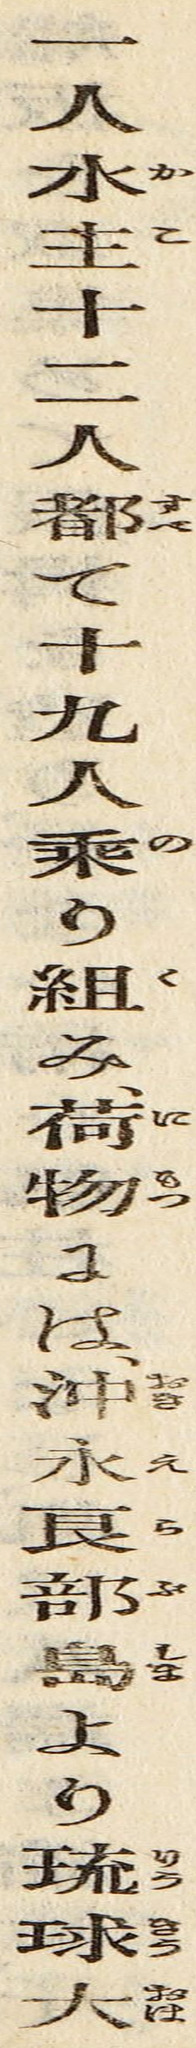一人水主十二人都て十九人乗り組み、荷物には、沖永良部島より琉球大
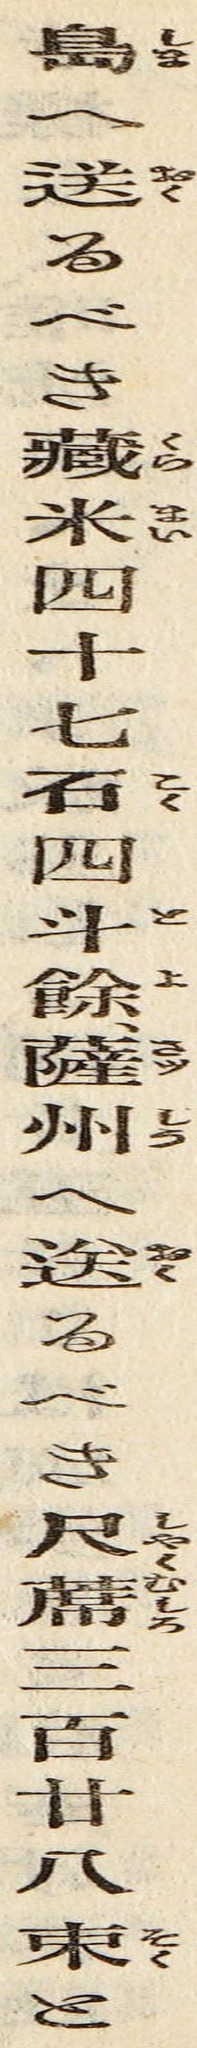島へ送るべき蔵米四十七石四斗余、薩州へ送るべき尺蓆三百廿八束と
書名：日本漂流譚
